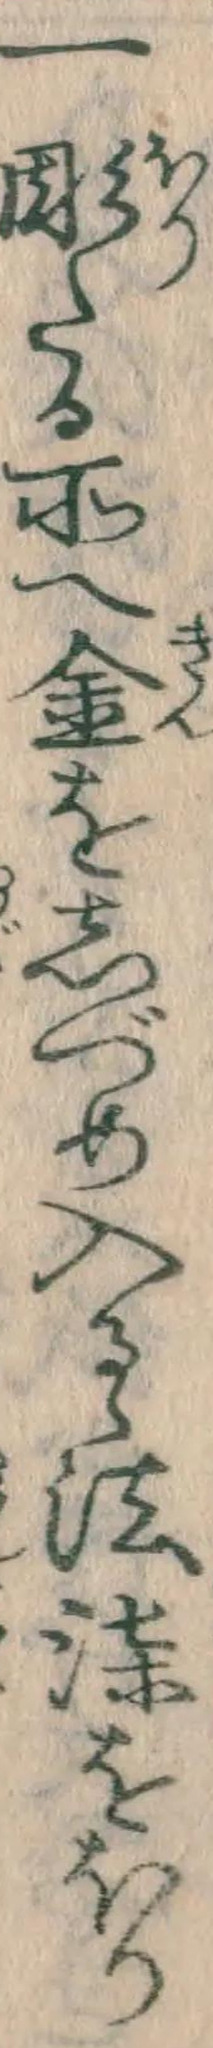一彫たる所へ金をしづめ入るゝ法漆をほり
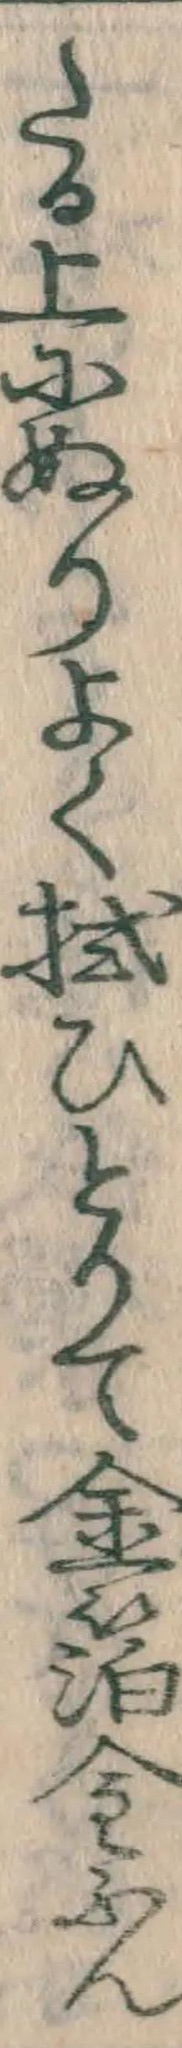たる上にぬりよく拭ひとりて金箔金ふん
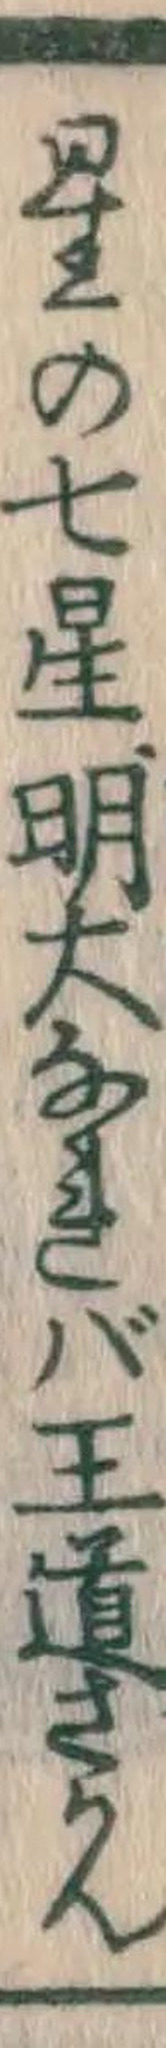星の七星明大なれば王道さかん
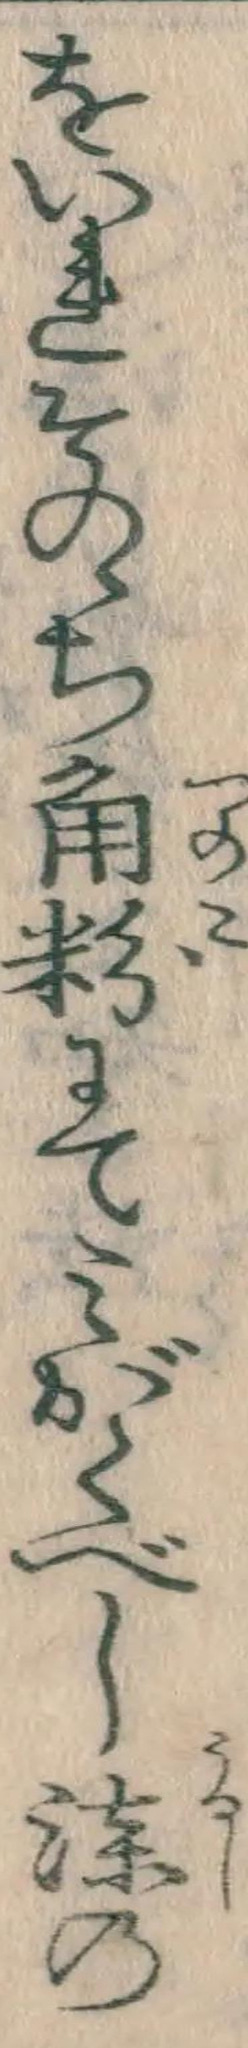をいれそのゝち角粉にてみがくべし漆の
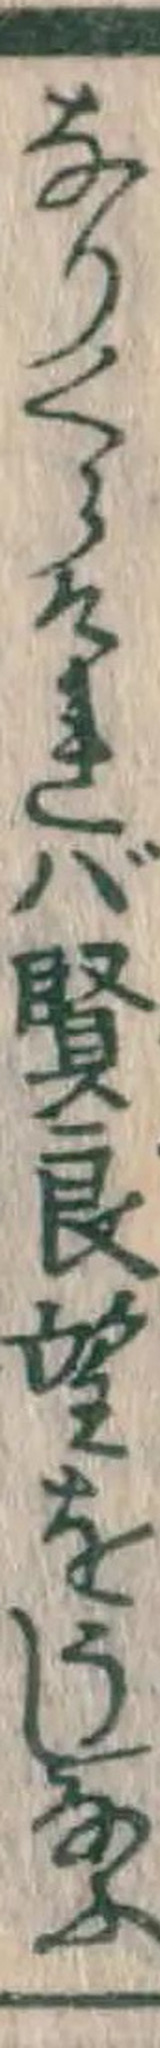なりくらければ賢良望をうしなふ
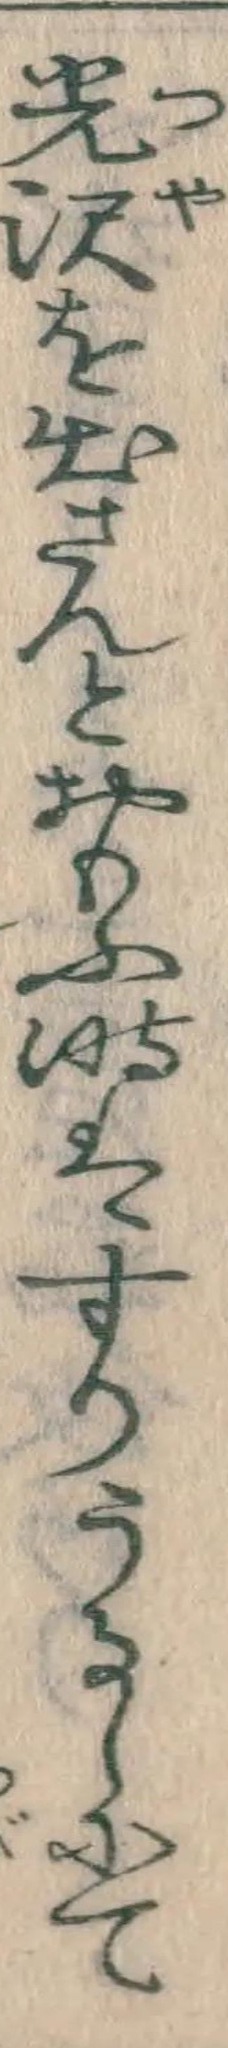光沢を出さんとおもふ時はすりうるしにて
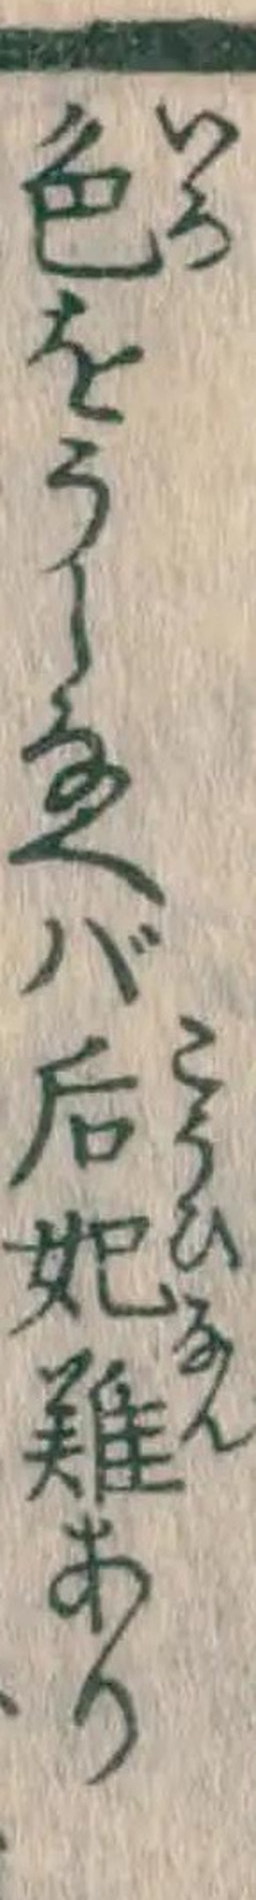色をうしなへば后妃難あり
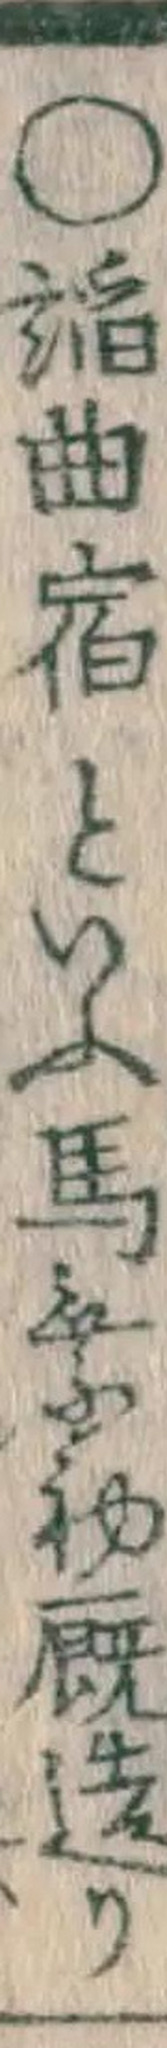○諂曲宿といふ馬乗初厩造り
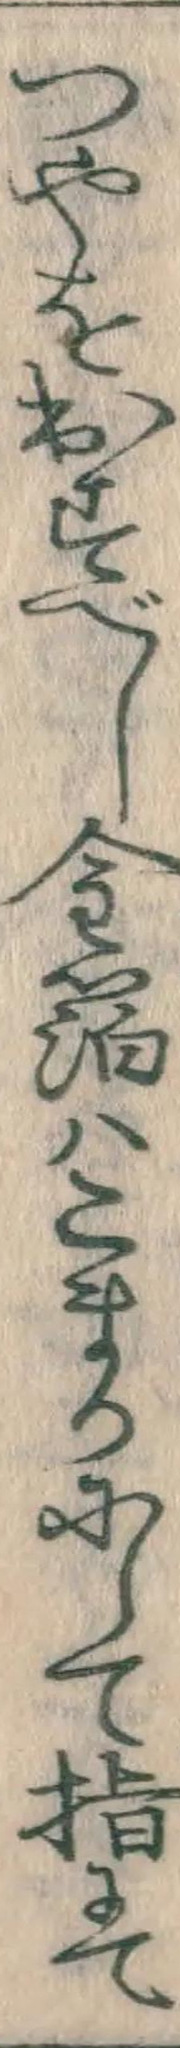つやを出すべし金箔はこまかにして指にて
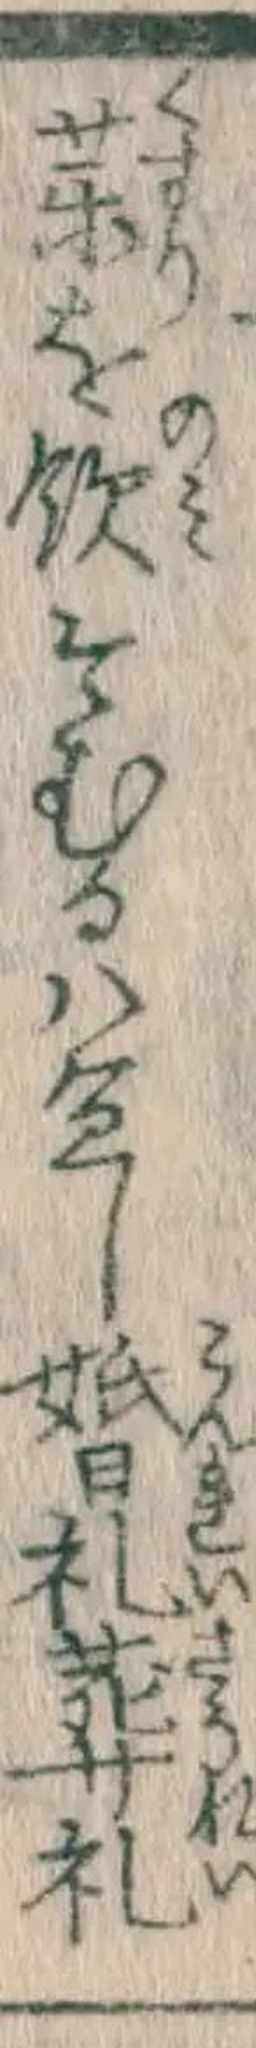薬を飲そむるは宜し婚礼葬礼
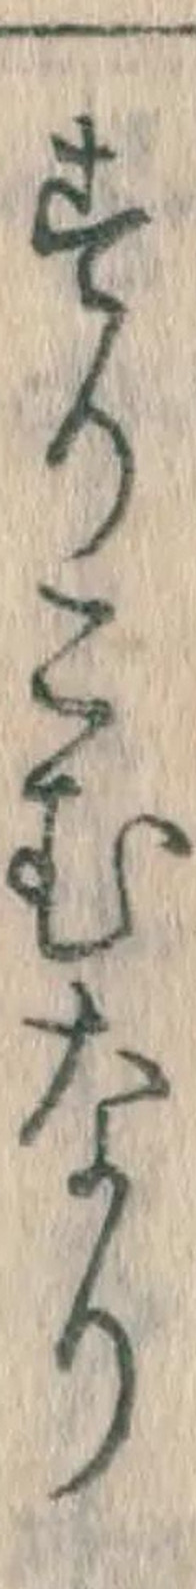すりこむなり
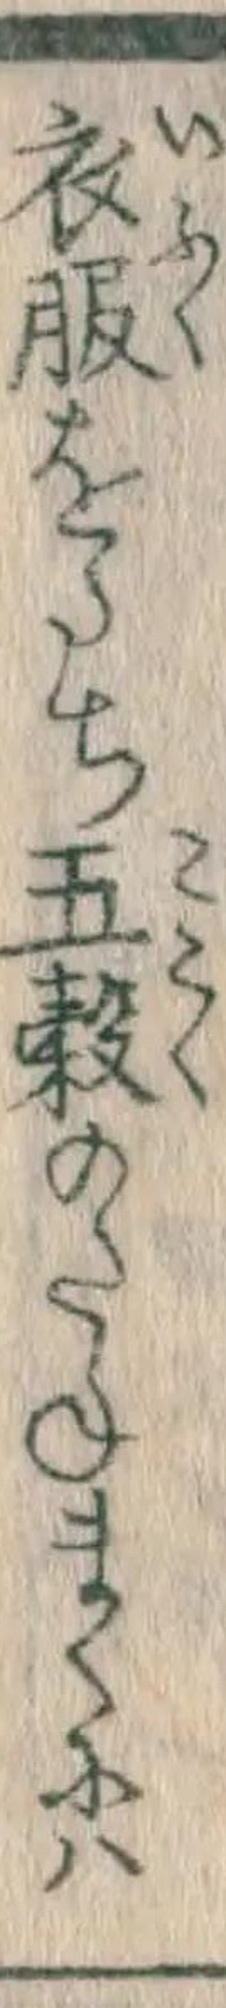衣服をたち五穀のたねまくには
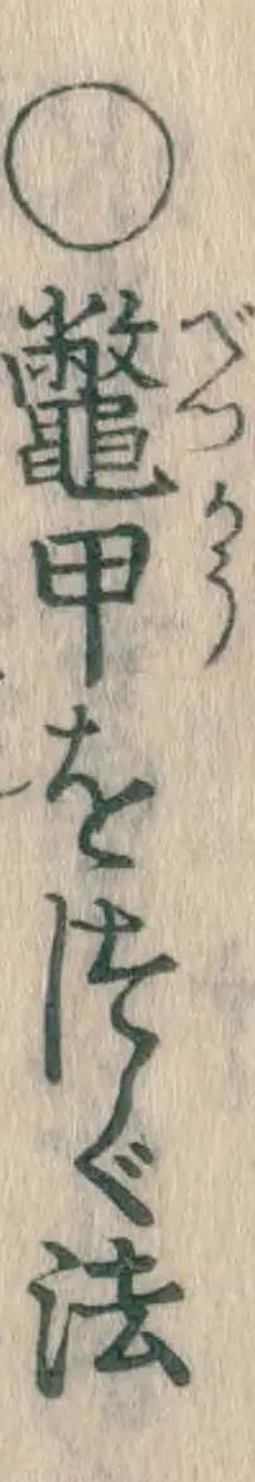○鼈甲をつぐ法
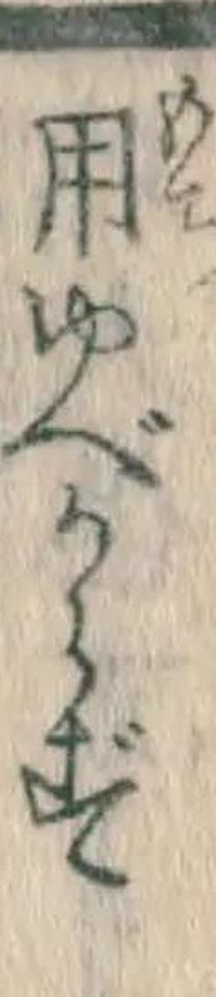用ゆべからず
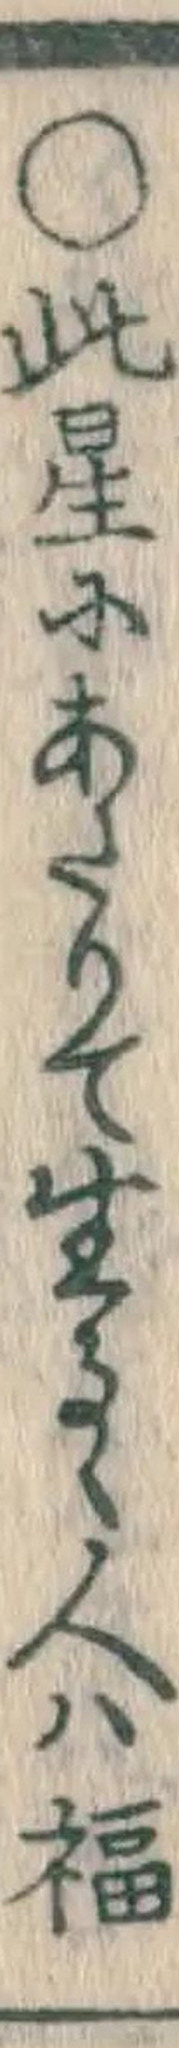○此星にあたりて生るゝ人は福
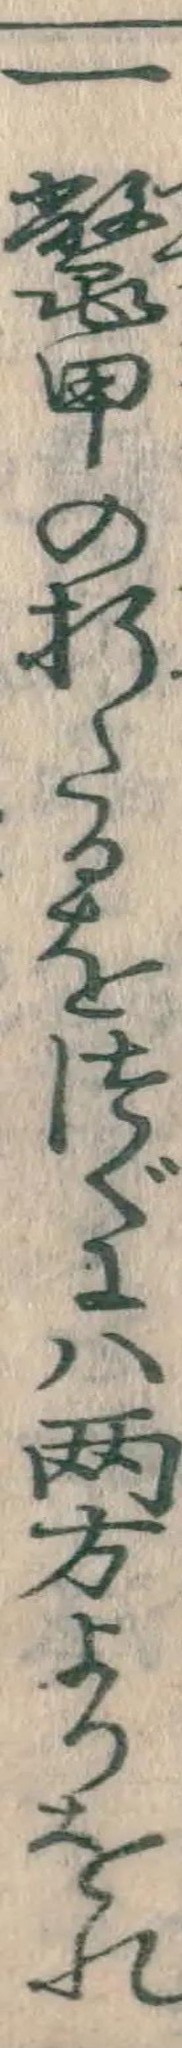一鼈甲の折たるをつぐには両方よりをれ
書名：広益秘事大全 3巻. [2]
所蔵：国立国会図書館 National Diet Library, JAPAN
